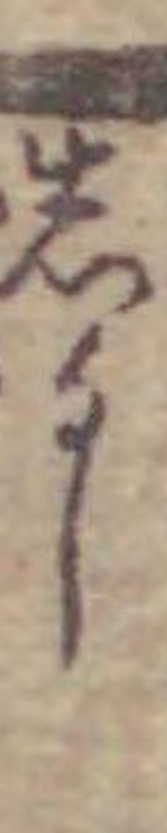しるし
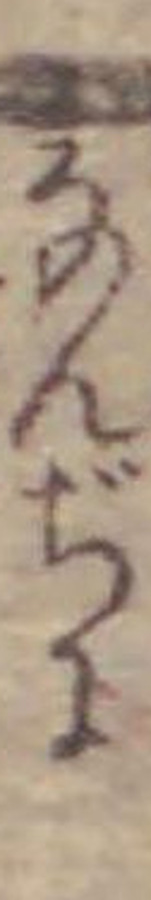なんぢに
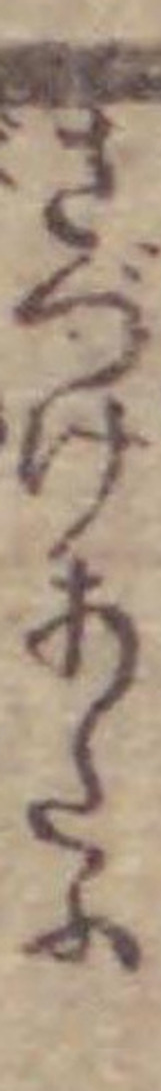さづけあたふ
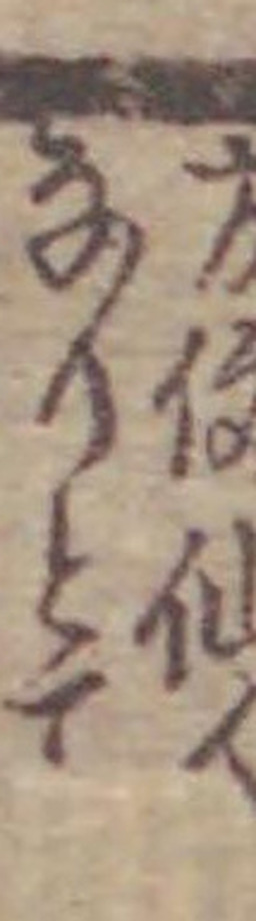なりとて
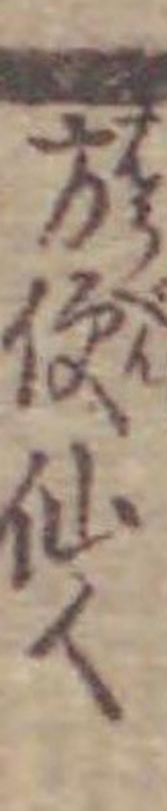方便仙人
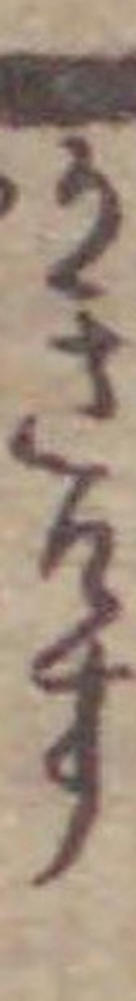かきけす
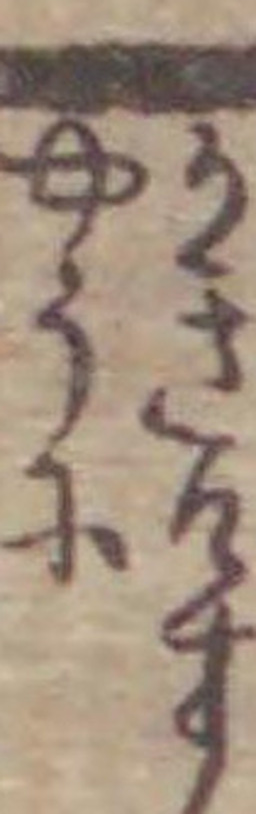やうに
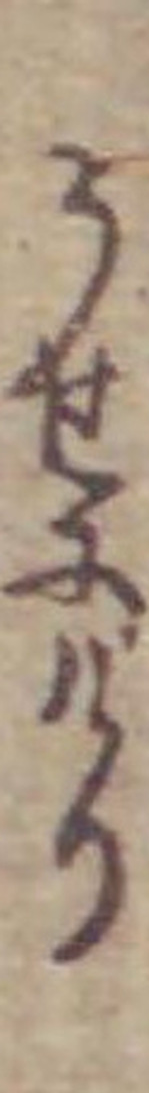うせにけり

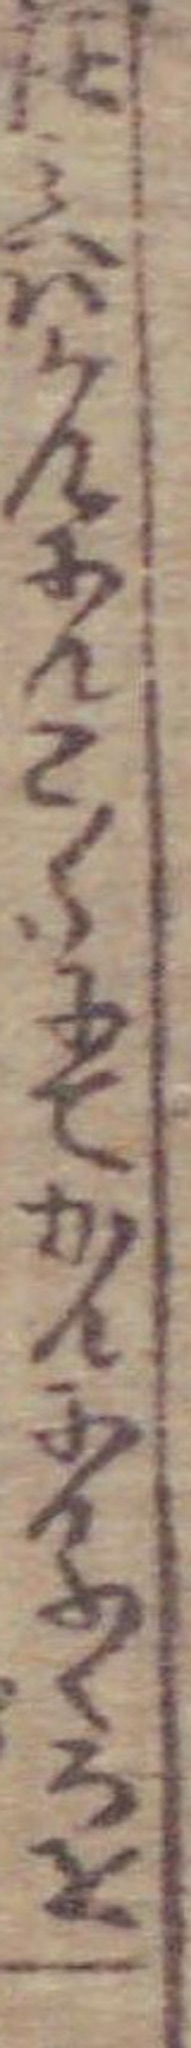和荘兵へはかんにんこくにてかんにんふくろを
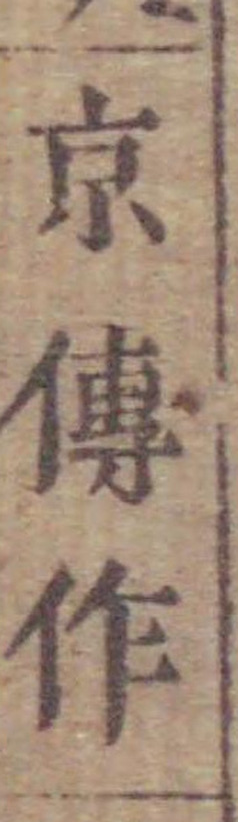京伝作
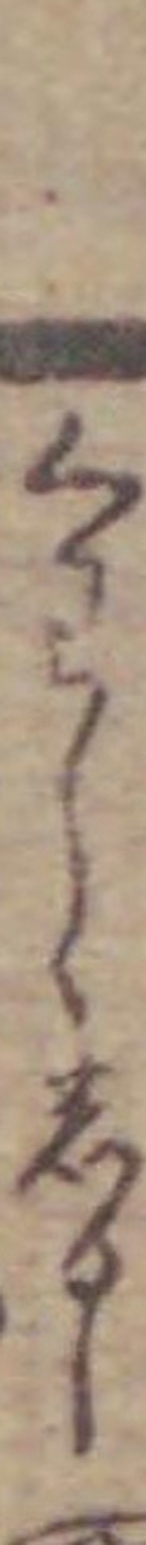くわしくしるし
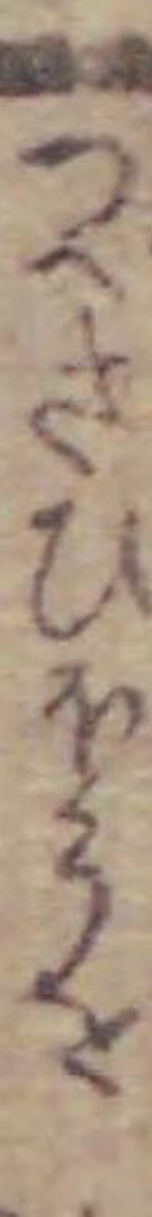つへきひほうを
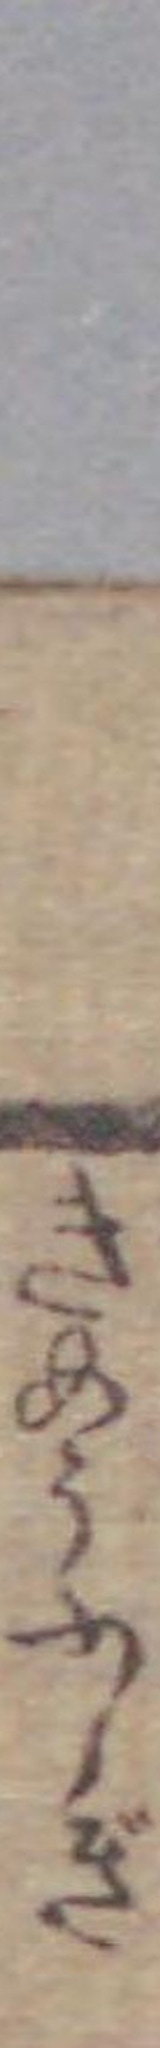きめうふしぎ
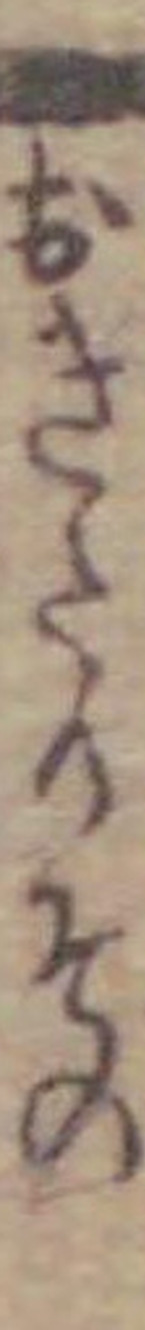おきたりその
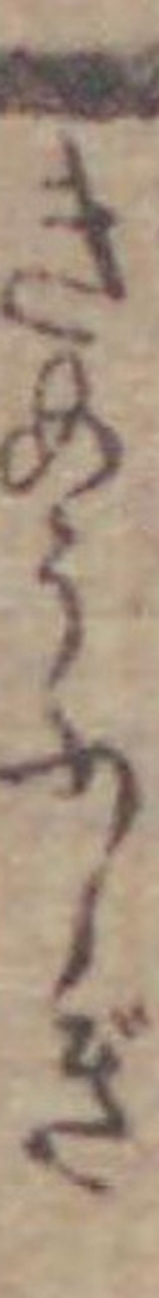きめうふしぎ
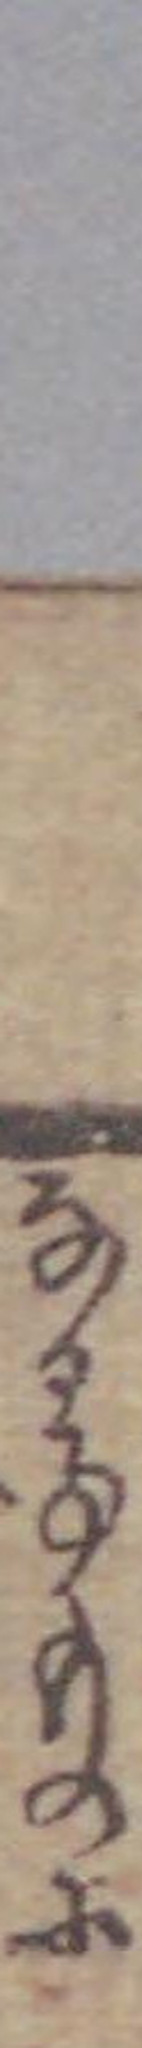なる事ものに
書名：和荘兵衛後日話 : 3巻
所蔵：国立国会図書館 National Diet Library, JAPAN
